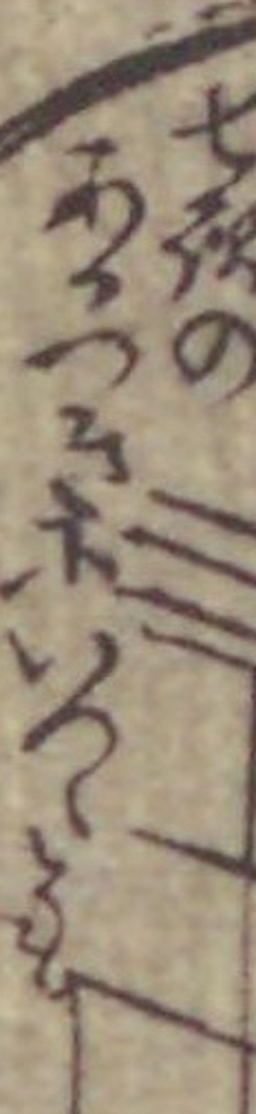あかつきにいつとも
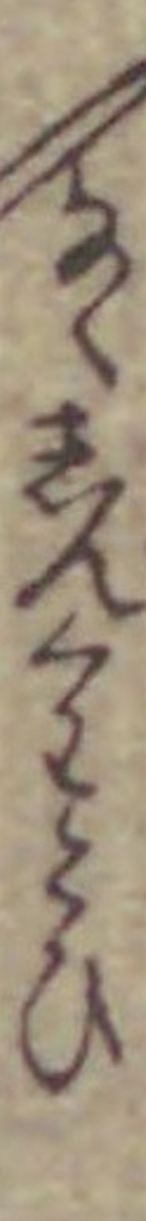なくしんくわとひ
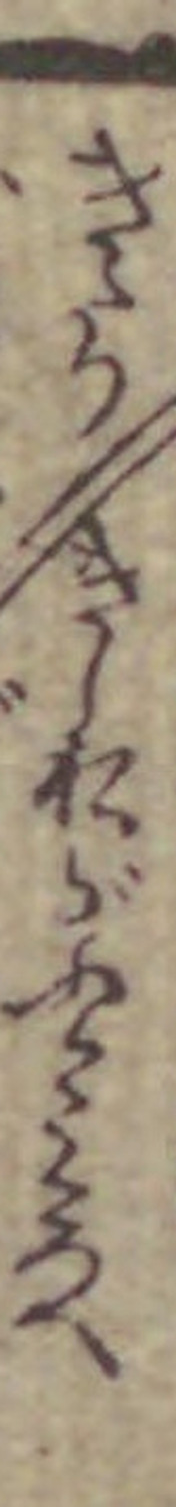きたりきし松がふところへ
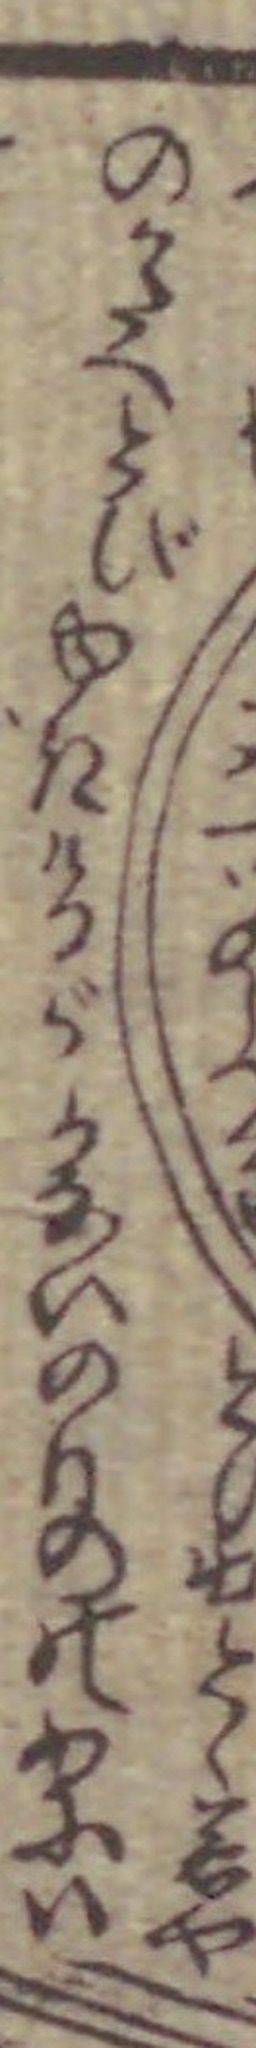のかたへとびゆきけるがかないのもののめには
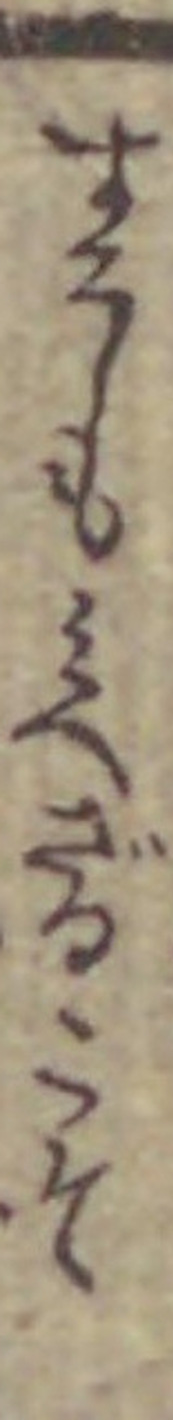すこしもみへざるこそ
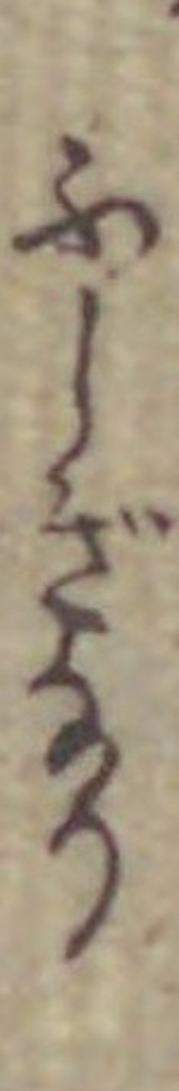ふしぎなり

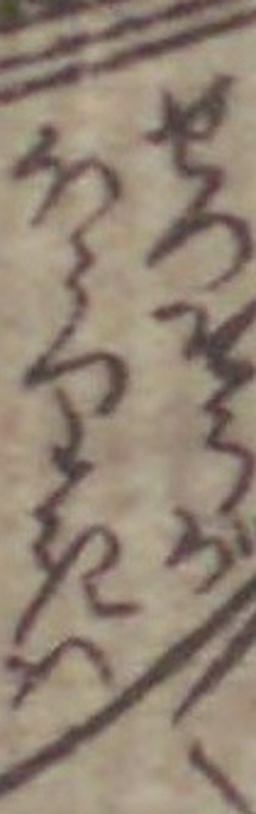ほうりきは
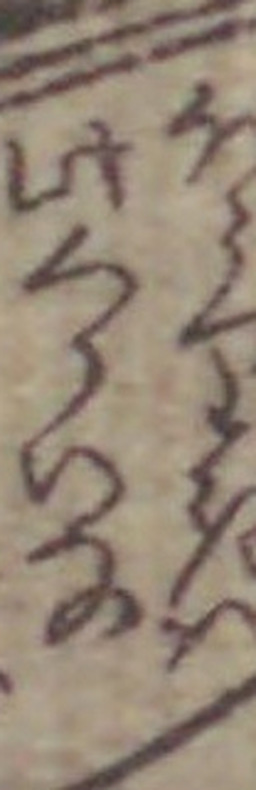此くらいな
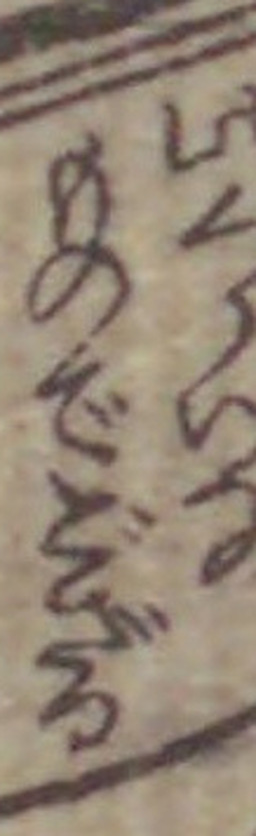ものでござる
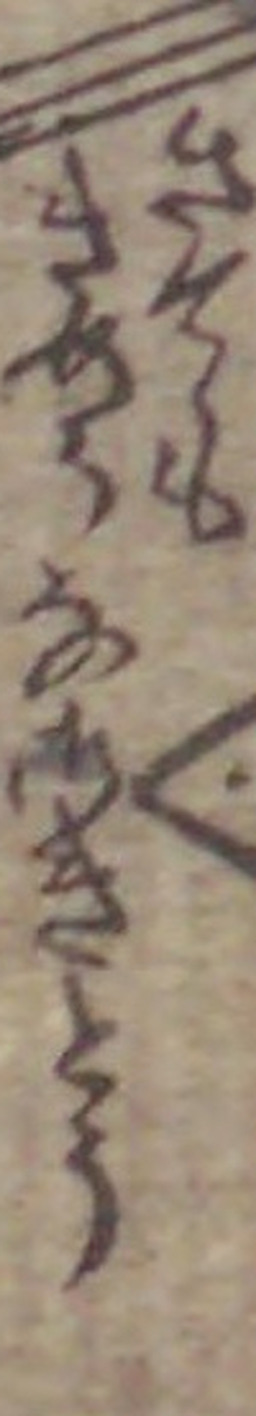きめうな御きとう
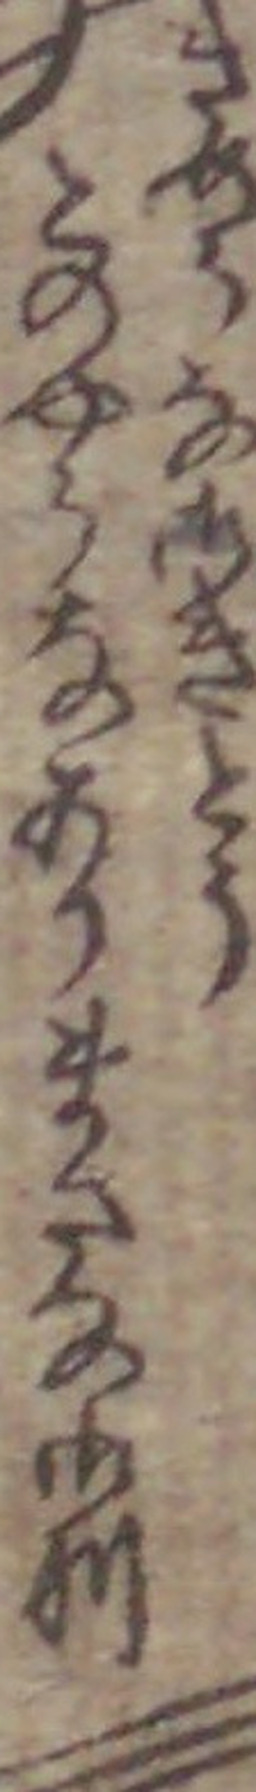このやうなありまさな御利
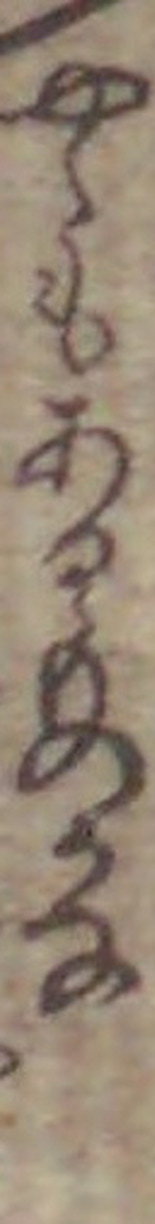やくもあるものかな
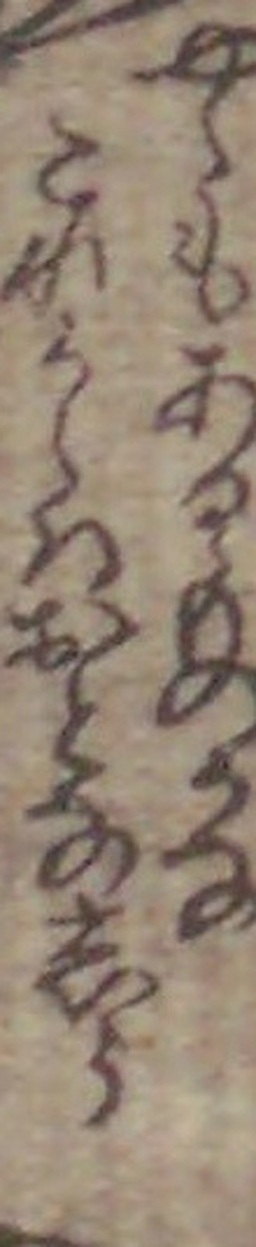これからはおとなしう

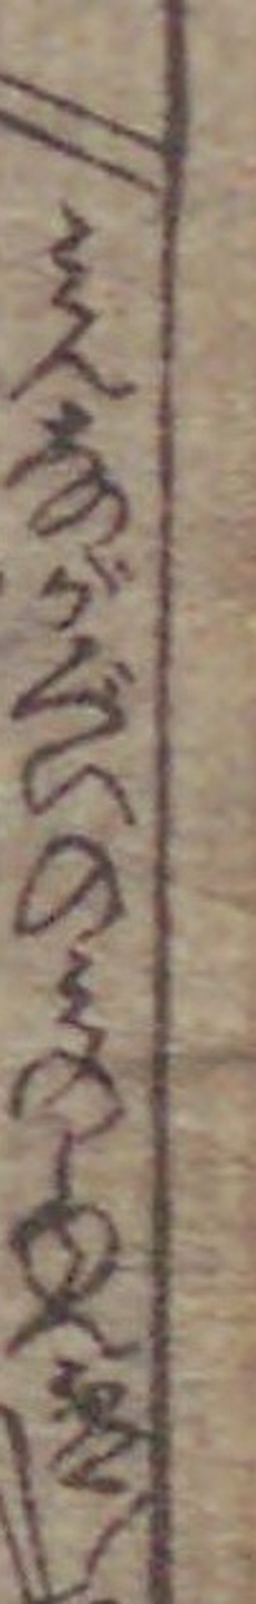みんながぐいのみのしゆんや
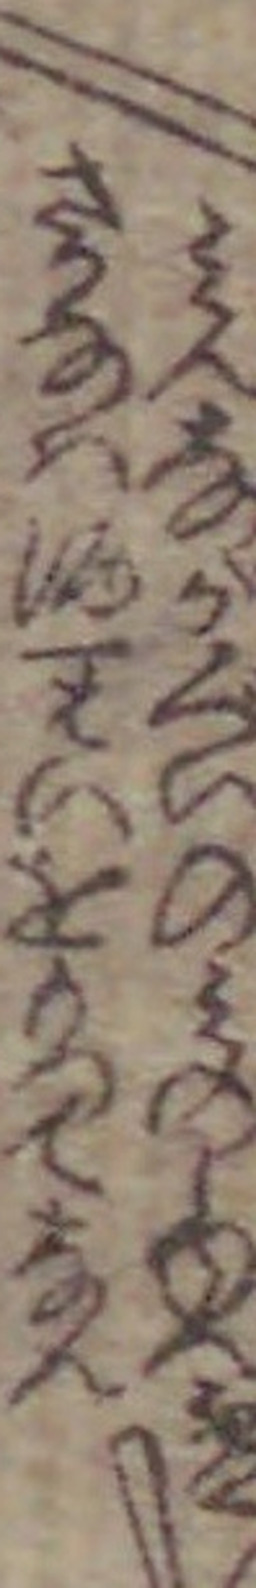さかなは酒一はいをもつてなん
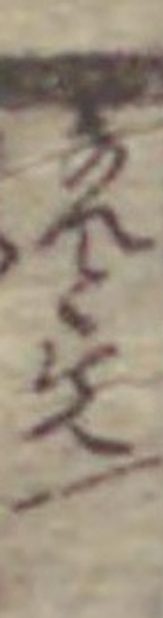なんと文
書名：止而道致虚録 3巻
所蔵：国立国会図書館 National Diet Library, JAPAN
